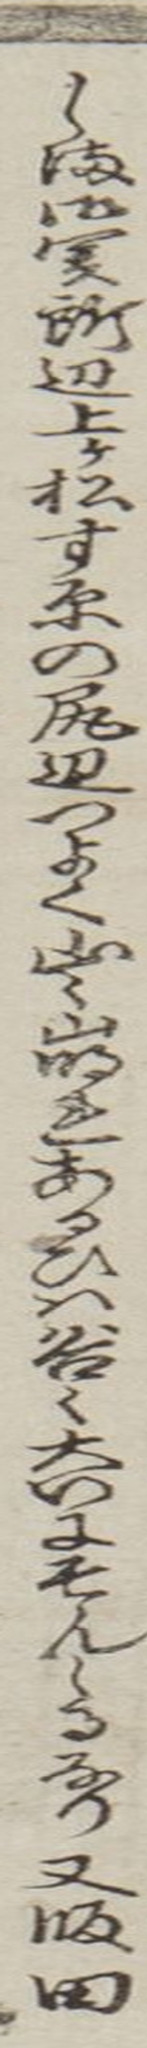しま御関所辺上ヶ松す原の尻辺つよく山々崩れあるひは谷々大いにそんしるなり又飯田
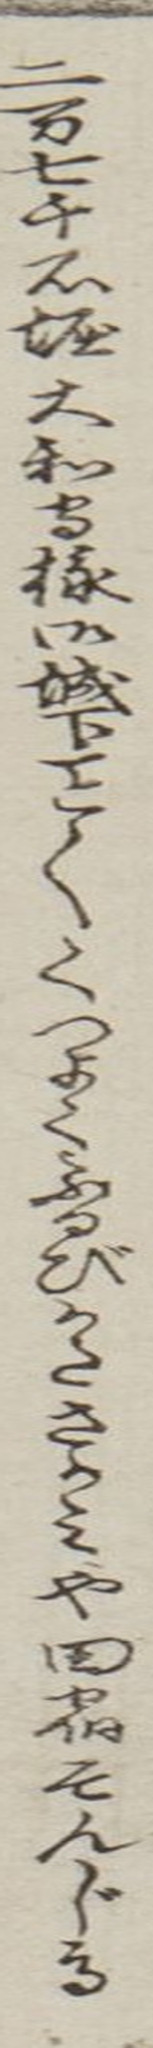二万七千石堀大和守様御城下こと〳〵くつよくふるびかたさかみや田宿そんじて
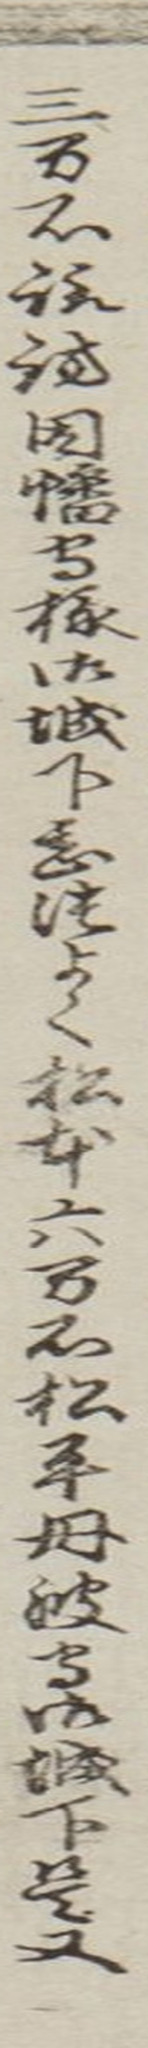三万石諏訪因幡守様御城下甚つよく松本六万石松平丹波守御城下是又
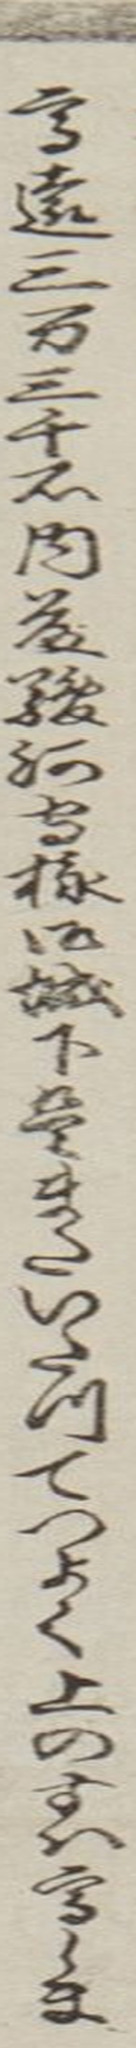高遠三万三千石内藤駿河守様御城下是またいたつてつよく上のすは高しま
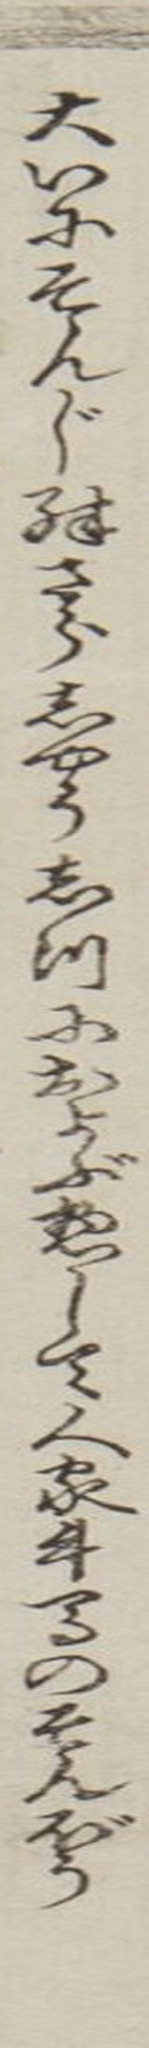大いにそんじ殊さらしやうしつにおよぶ惣して人家牛馬のそんぼう
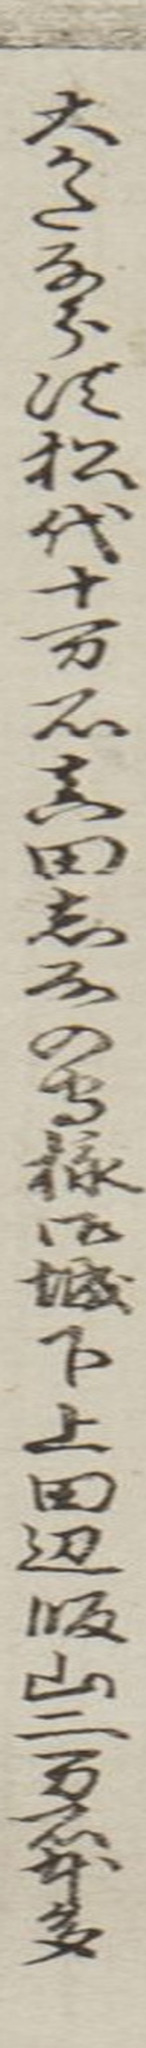大かたならす松代十万石真田しなの守様御城下上田辺飯山二万石本多
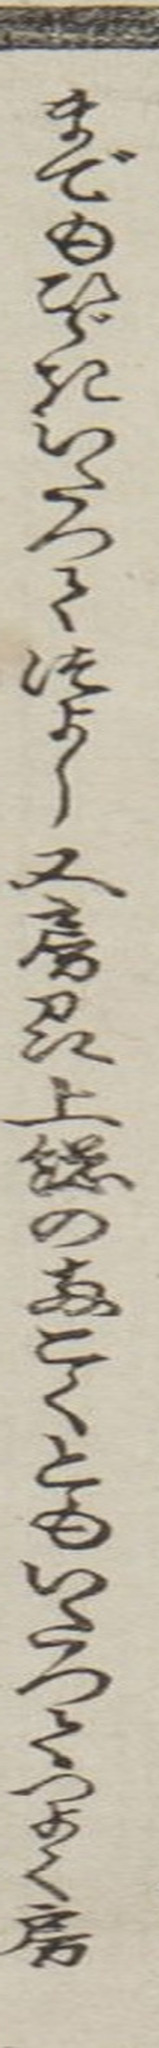までもひゞきいたつてつよし又房州上総の両国ともいたつてつよく房
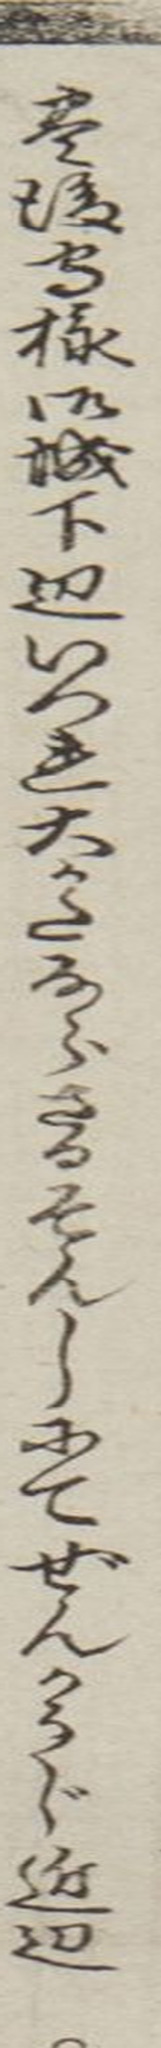豊後守様御城下辺いつれ大かたならさるそんしにてぜんかうじ近辺
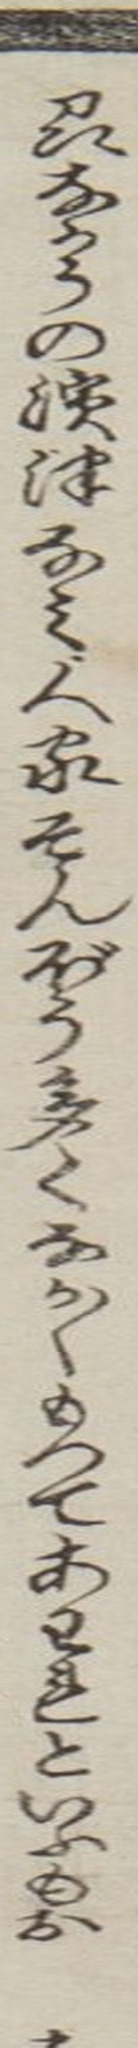州なかうの浜津なみ人家そんぼう多くなか〳〵もつてあわれといふもお
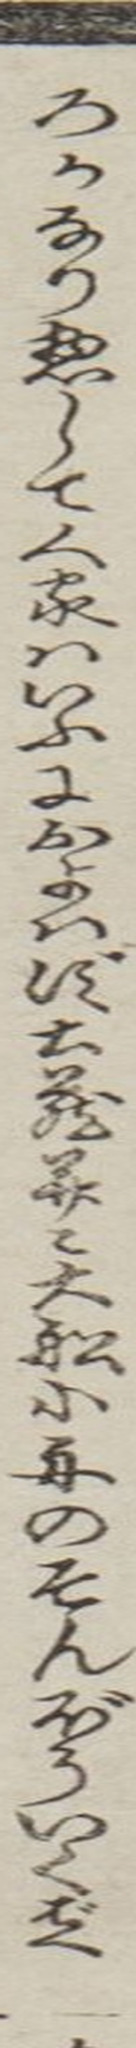ろかなり惣して人家はいふにおよはず土蔵并に大船小舟のそんぼういくばく
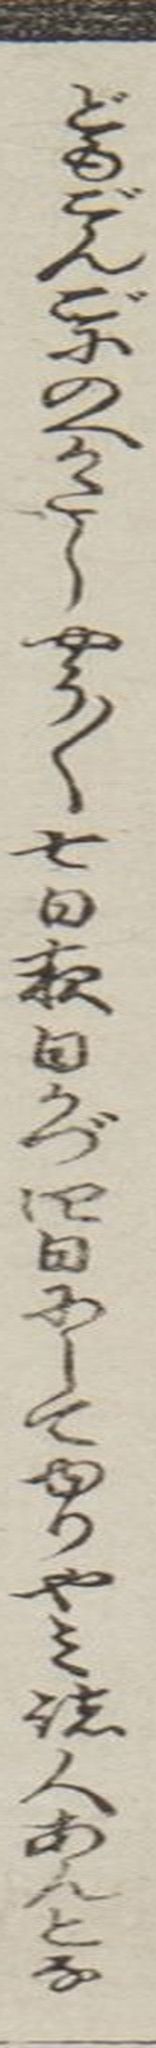どもごんごにのへかたしやう〳〵七日夜日かづ四日にしてゆりやみ諸人あんとな
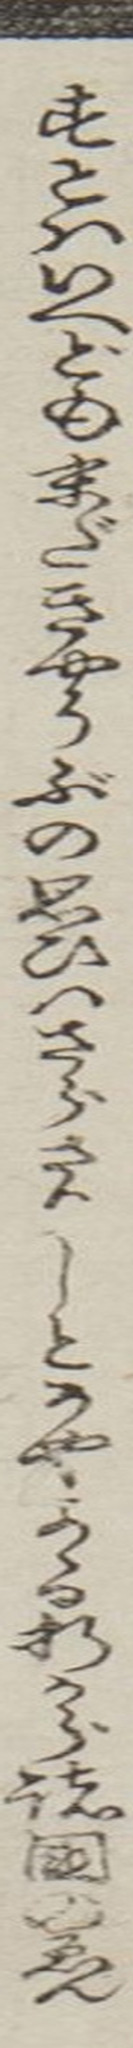すとはいへども未だきやうぶの思ひはさらさりしとかやかゝる折から諸国のゑん
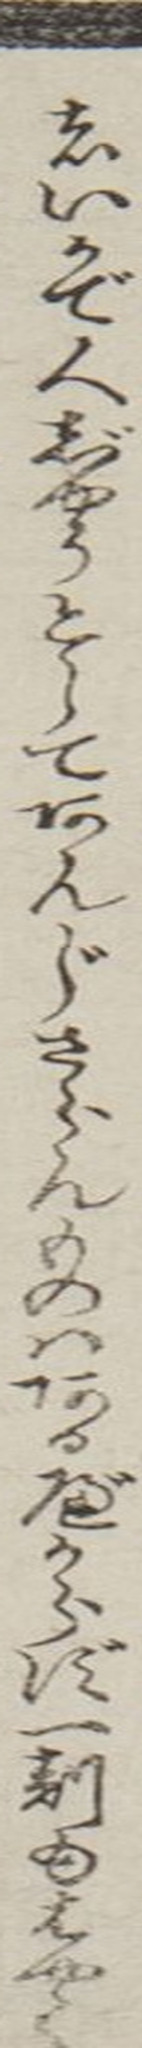者いかで人じやうとしてあんじさらんものはあるべからず一刻もはやくこの
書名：十箇国大地震の図
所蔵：あいおいニッセイ同和損保株式会社
